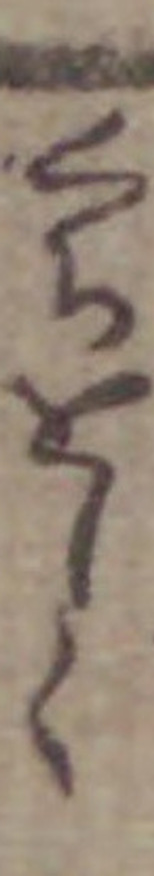くちをしく
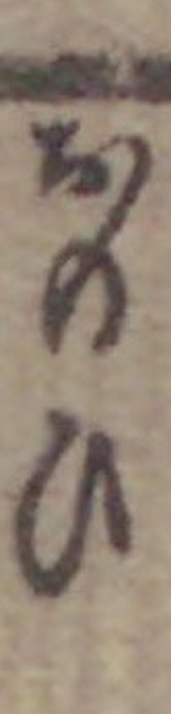おもひ
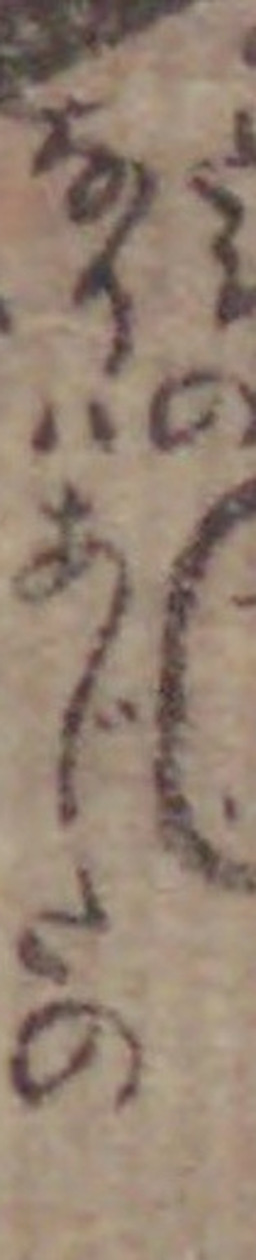なりはあじたの
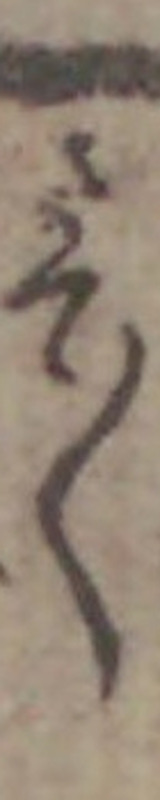さて〳〵
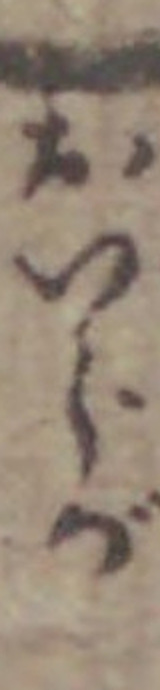おいらが
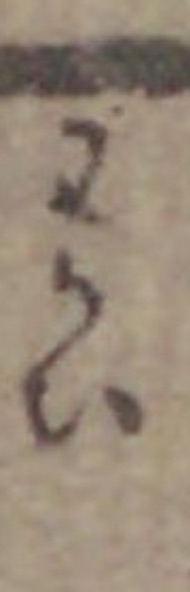わかい
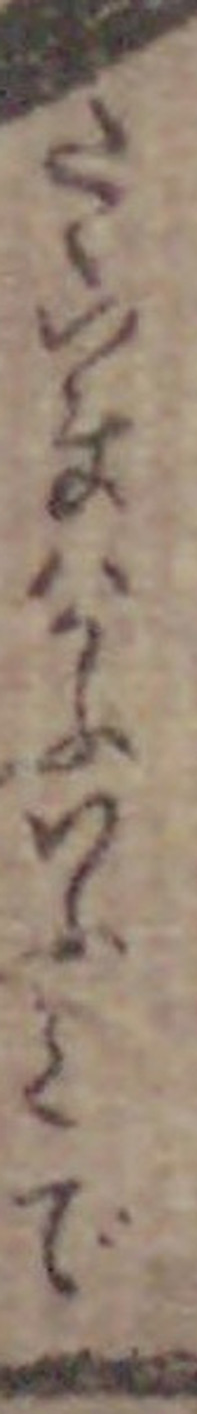たゝいまはかふいふみで
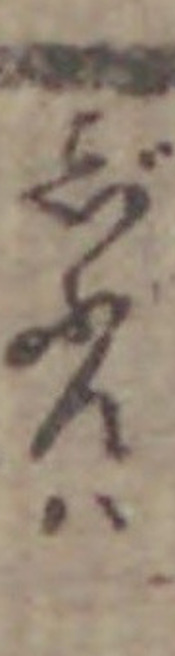じぶんは
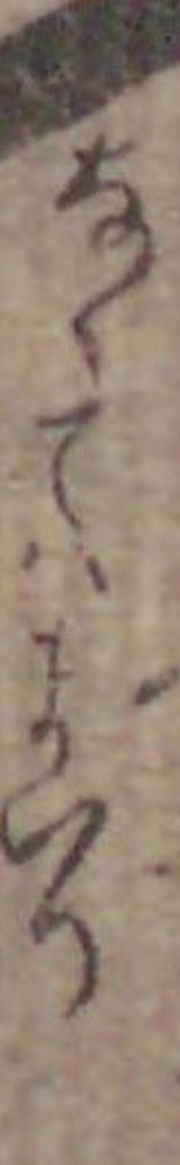なくてはまいり
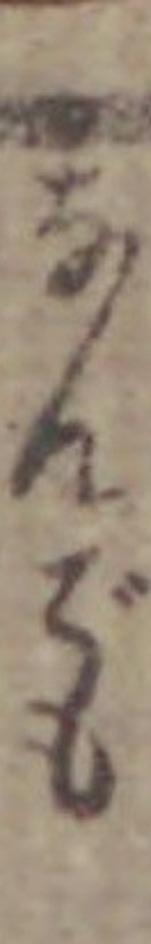なんでも
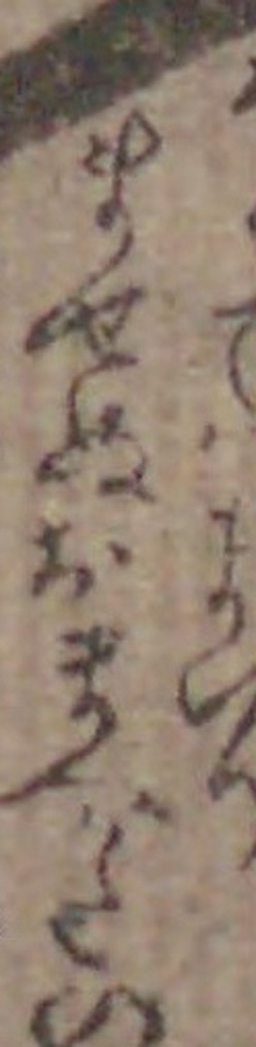ませぬおまへかたの
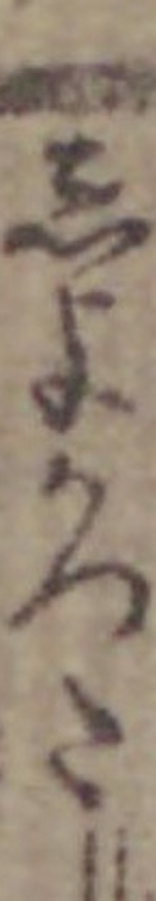しよかつた
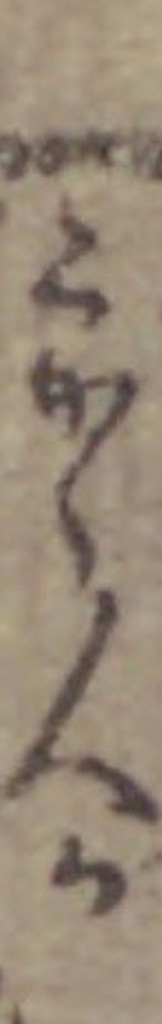とかく人が
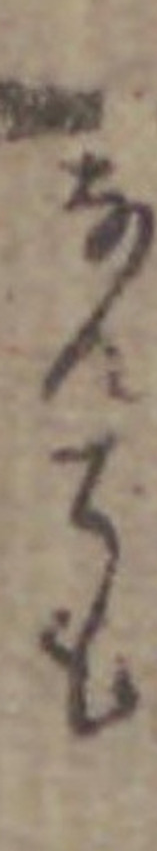なんでも
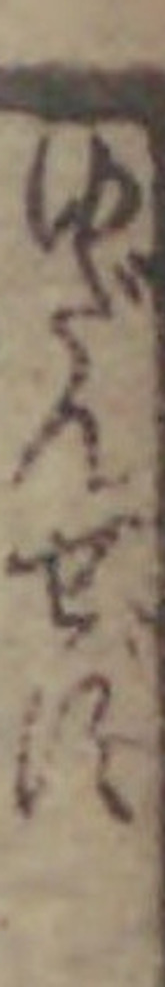ゆだんせず
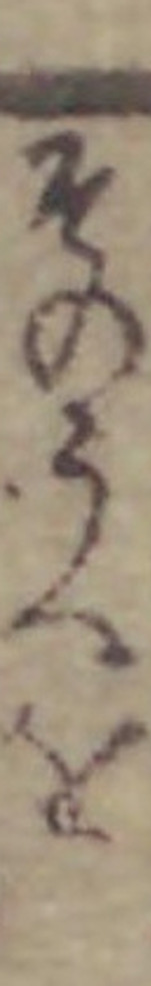そのうへを
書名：化物鼻がひしげ 2巻
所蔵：国立国会図書館 National Diet Library, JAPAN
